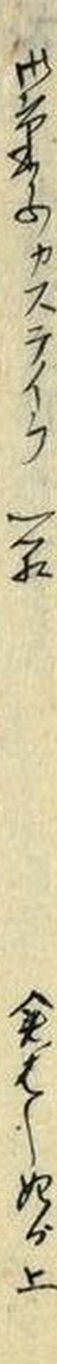御菓子カステイラ一箱倉はし始ゟ上
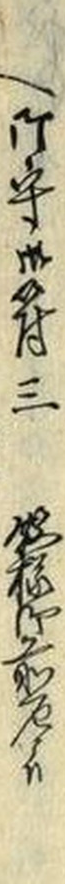御守御符三殿様御前厄ニ付
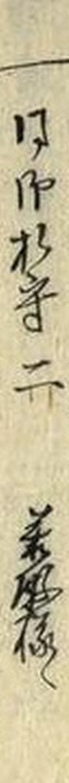同御札守二若殿様へ
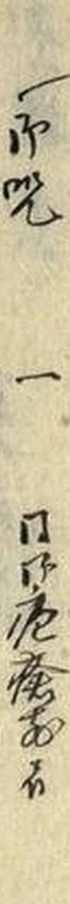御咒一同御疱瘡前ニ付
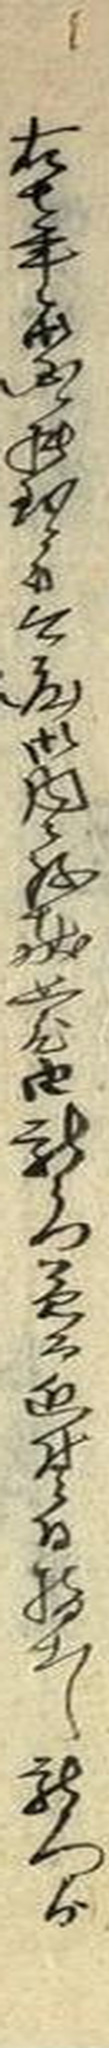右は年々御国へ罷越候ニ付今度御内々致献上度由新右衛門兼而仰付候付指出之新右衛門ゟ
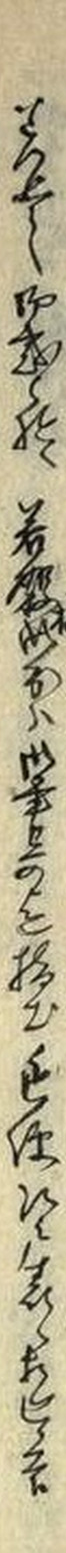差上之御戴被遊若殿様分ハ御年寄迄指出近便次ニ表へ相廻候筈
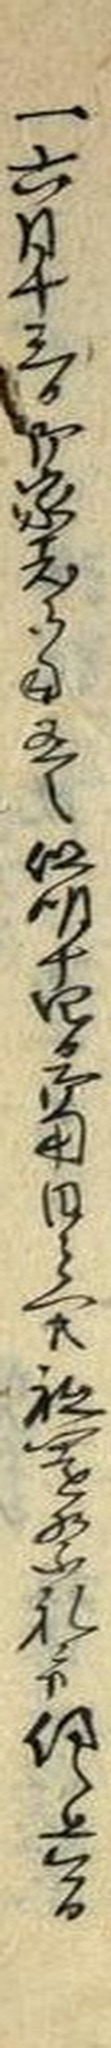一六月十三日御家老御用有之但明十四日御用日ニ候へ共祖還祭礼ニ付伺之上今日
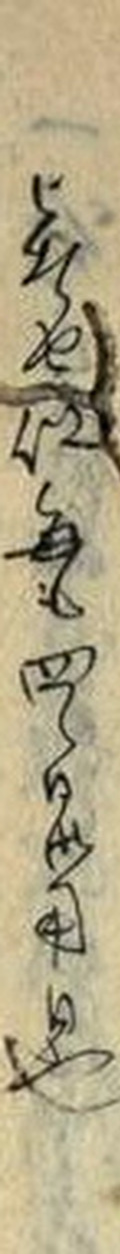被出候由但毎も四之日御用日也

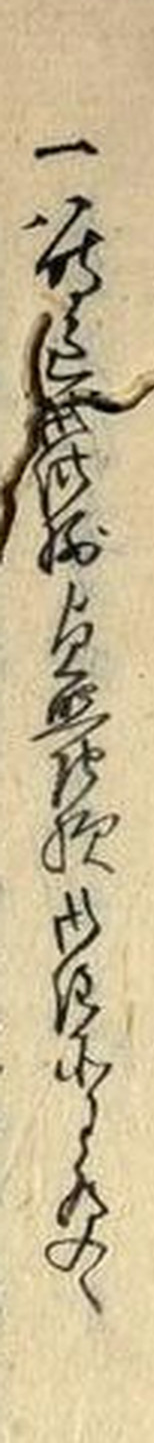一八時過御供揃貞照院様御住所へ被為入候
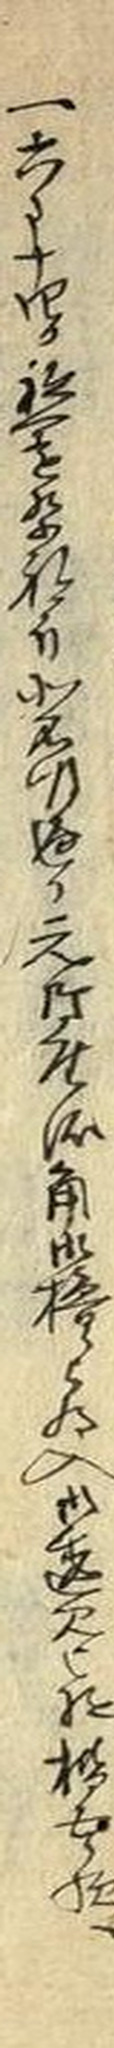一六月十四日祇園祭礼ニ付北不明通り元御座所角御櫓へ被為入御透見被遊揩五郎様
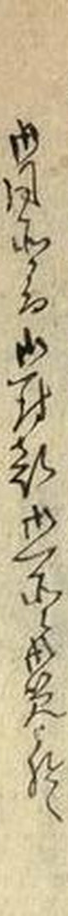御同所二而御対顔御一所ニ御覧被遊候
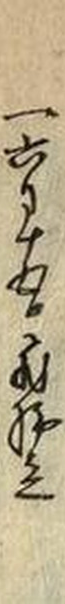一六月十五日飛脚立
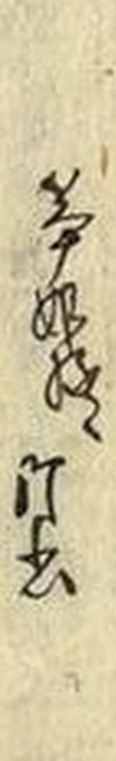箏姫様ゟ御書
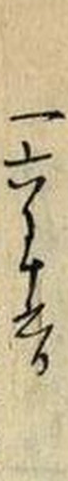一六月十六日
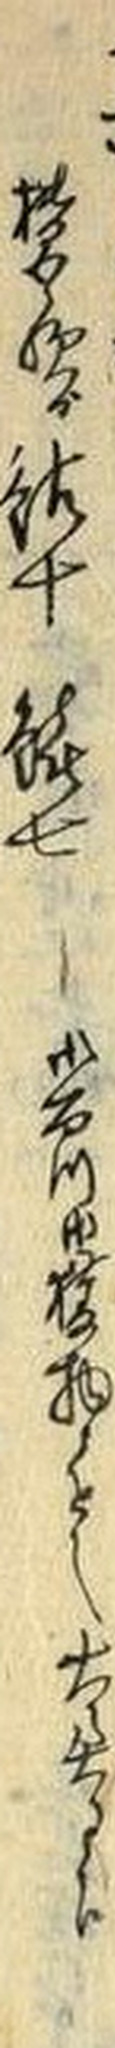揩五郎様ゟ鮎十鱚七御留川御獲物被進之大奥へ被下
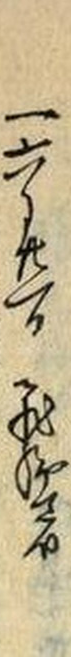一六月廿一日飛脚着
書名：少傅日録抄（斉承付側向頭取日記、在国）
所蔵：福井県文書館 Fukui Prefectural Archives
